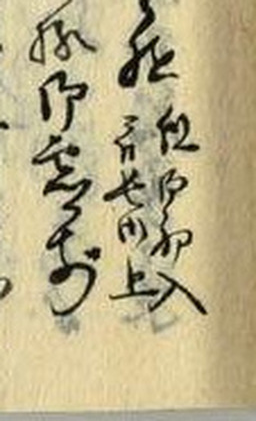ニ付長御上
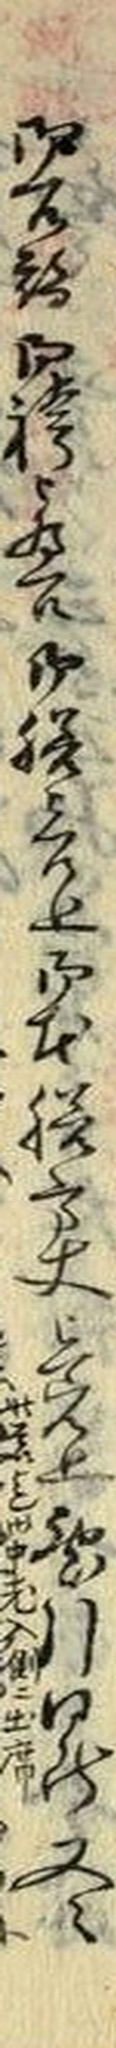御召替御袴被為召御膳被召上御本膳方丈被差上台引同断又々
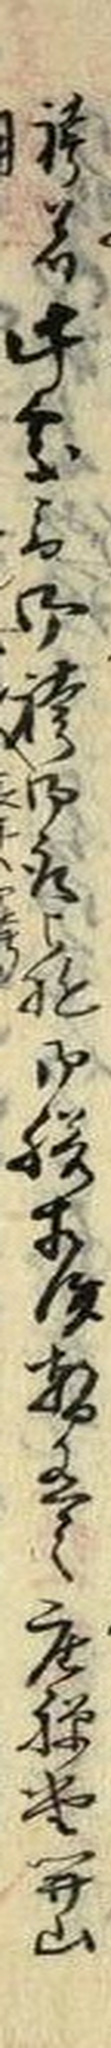用此処ニ而御袴御取被遊御膳相済暫有之座禅堂開山
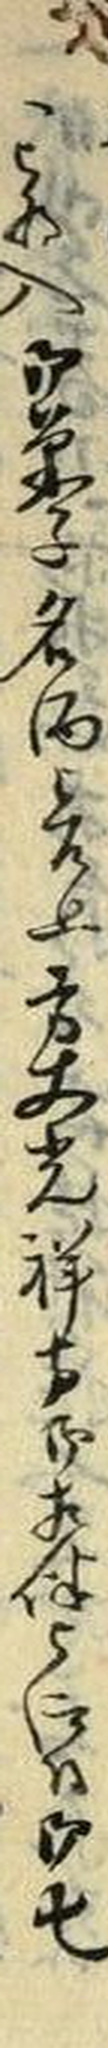へ被為入御菓子名酒被召上方丈光祥方御相伴被仰付御匙
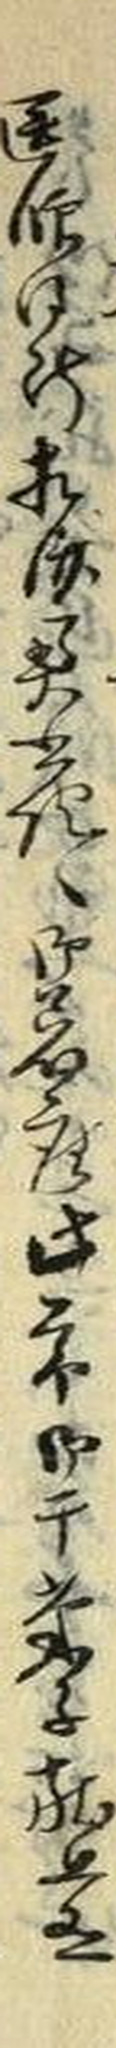医師同断相済奥書院へ御着座此節御干菓子献上有
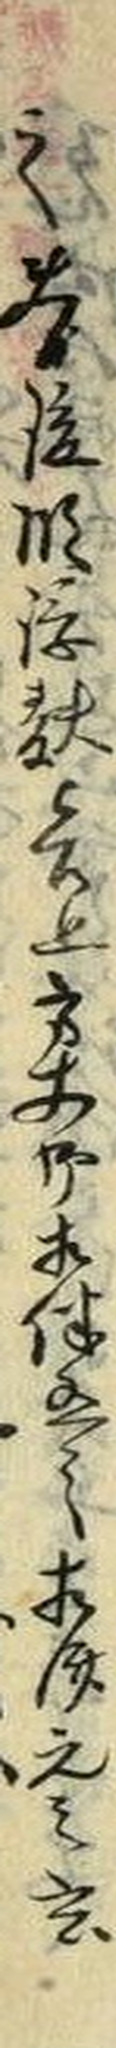之夫ゟ後段浮麸被召上方丈御相伴有之相済元之玄

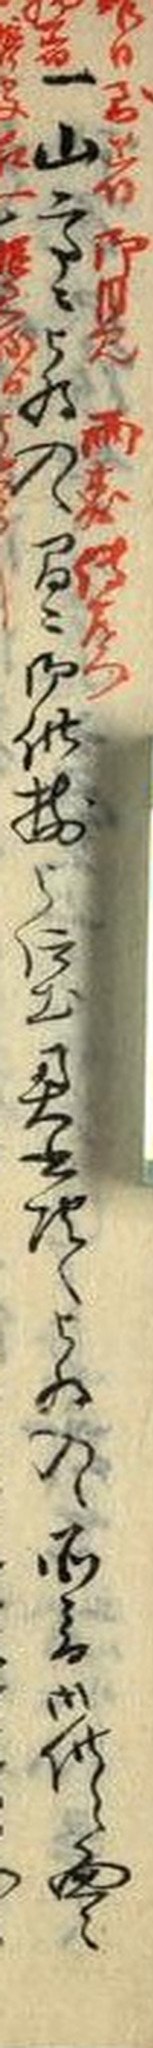一山亭ニ被為入候間ニ御供揃被仰出奥書院へ被為入候所ニ而御供之面々
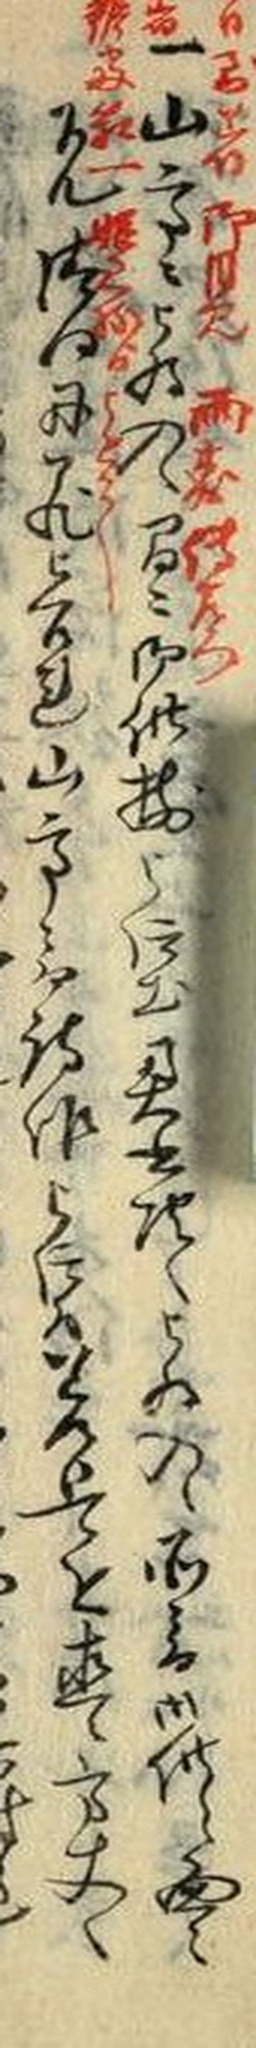下ル清田丹蔵被召連山亭ニ而詩作被仰付差上候を直ニ方丈へ
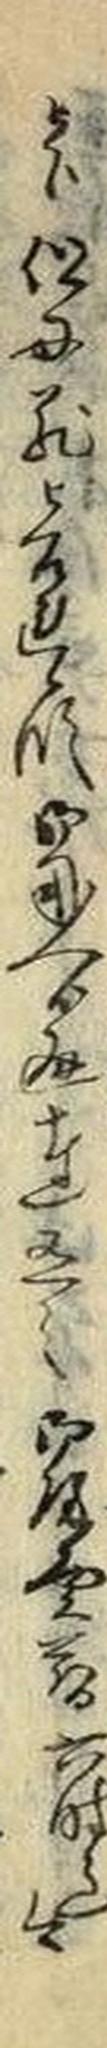被下但丹蔵被召連候段御用人ゟ通達有之御帰殿暮六時過今
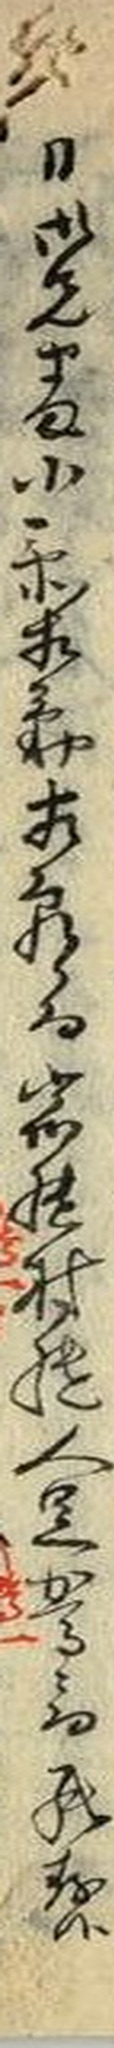日御先番小兵衛相勤相願候而宿継村継人足駕ニ而罷越候
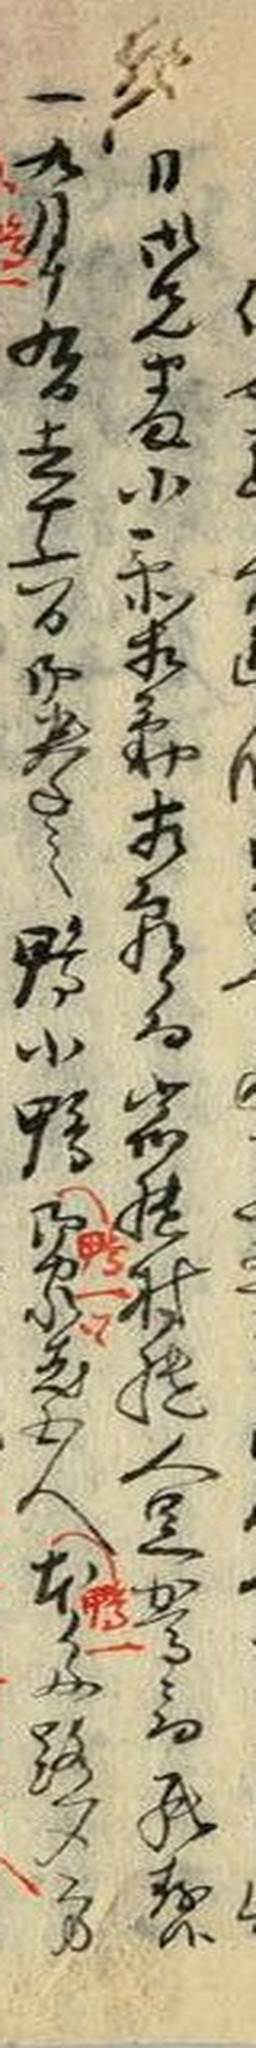一九月十九日去十六日御拳之鴨小鴨御家老五人本多路夕方
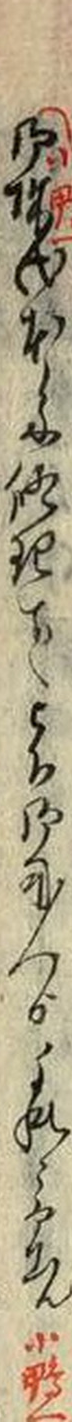御城代本多修理方へ被下御用人ゟ手紙ニ而出ル
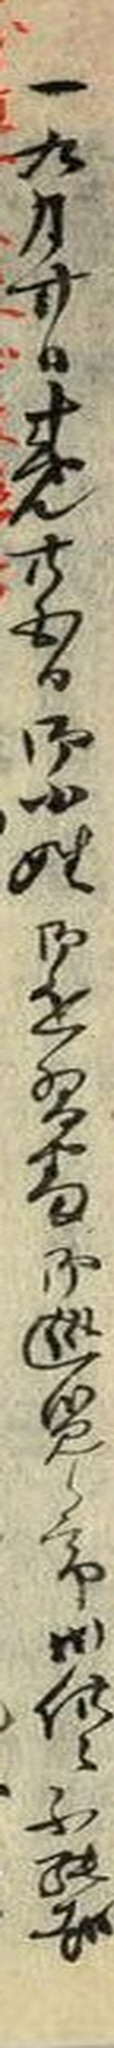一九月廿日来ル廿五日御小姓御近習番御巡覧之節御供ニ不罷越
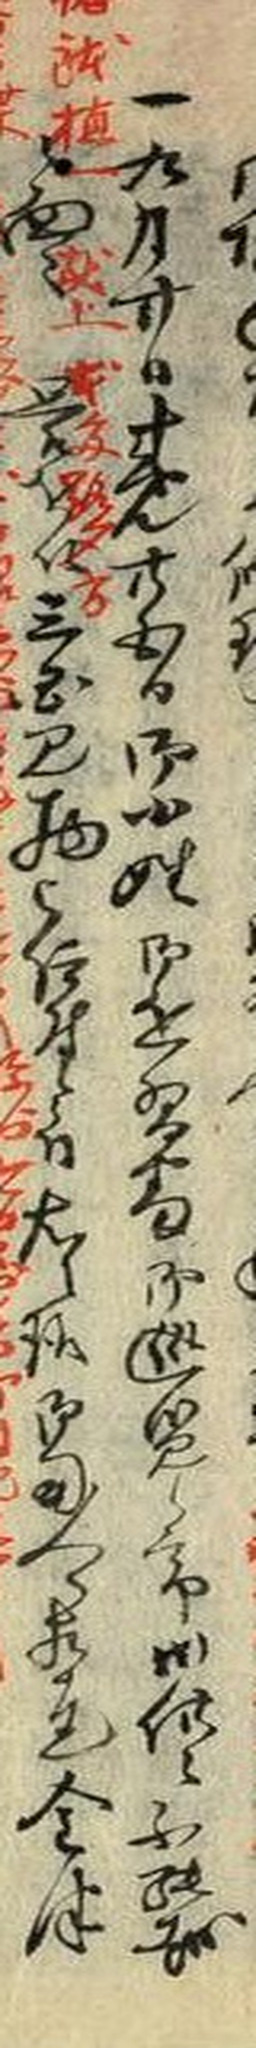之面々思召を以三国見物被仰付候ニ付右之趣御用人へ相達金津
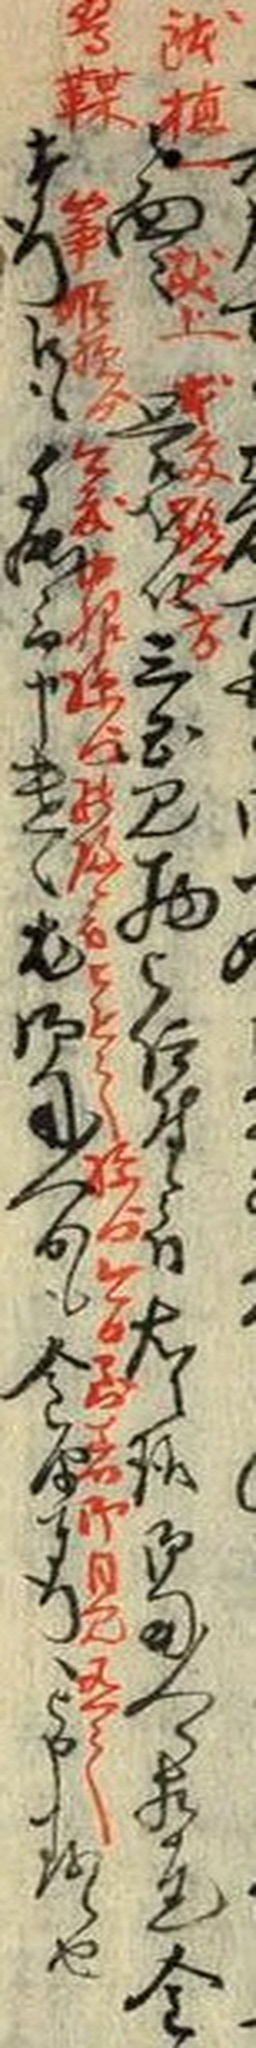奉行江も手紙ニ而申遣候尤御用人ゟも金津奉行へ被申越候由
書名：少傅日録抄（斉承付側向頭取日記、在国）
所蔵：福井県文書館 Fukui Prefectural Archives
